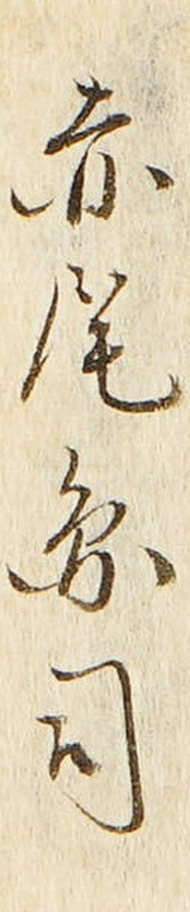赤尾国司
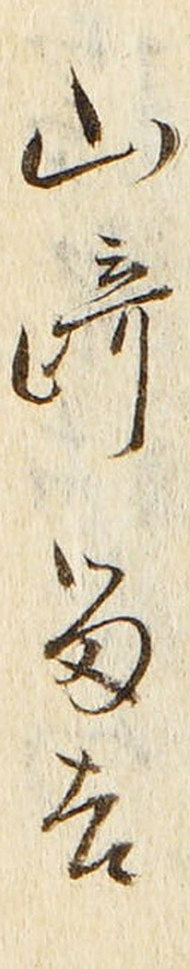山崎留吉
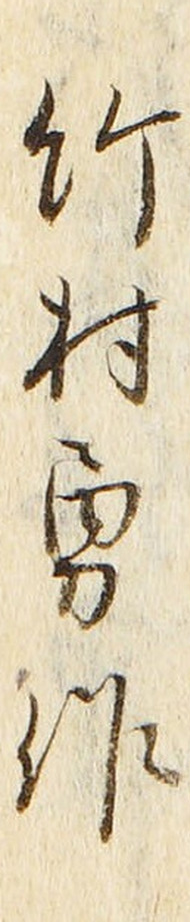竹村勇作
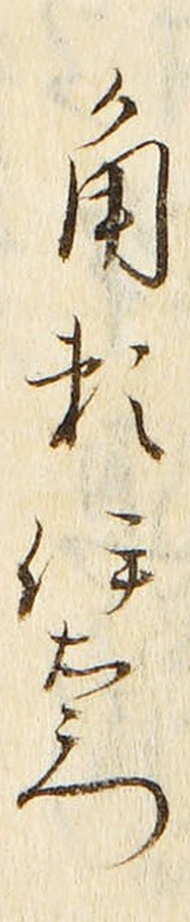角頼伊右衛門
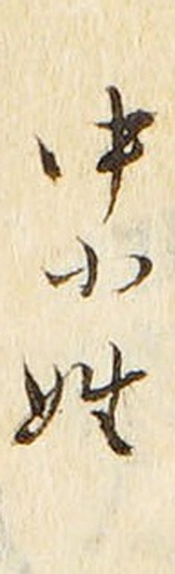中小姓
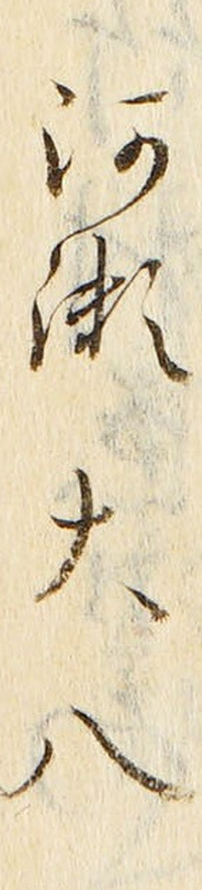河瀬大八
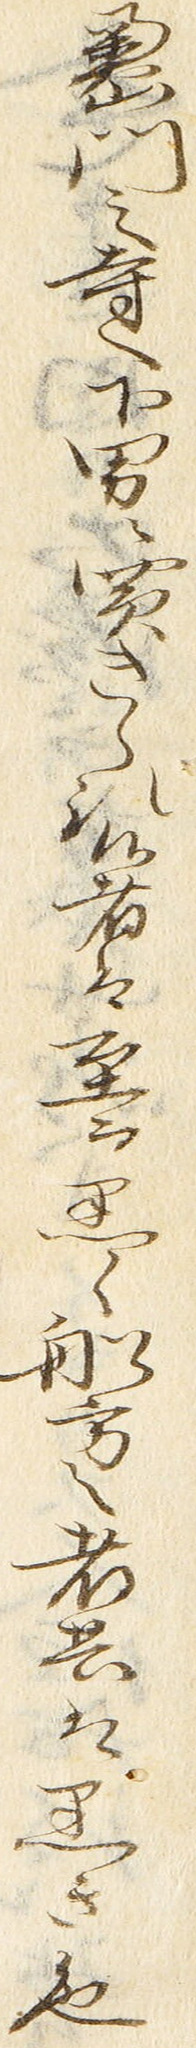嶴門之寺へ下男に買きられ候者は至而黒く船方之者は黒き色
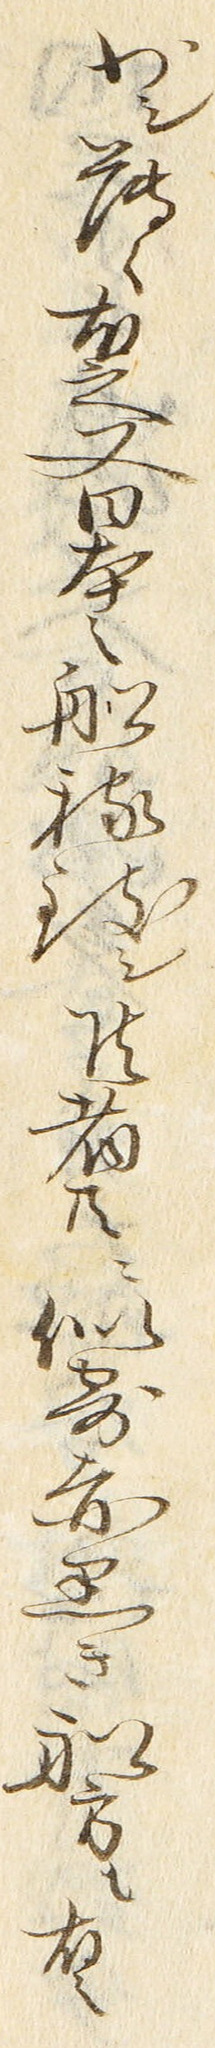少し薄く有之又日本之船稼致し候者共に似寄赤黒き船方も有之
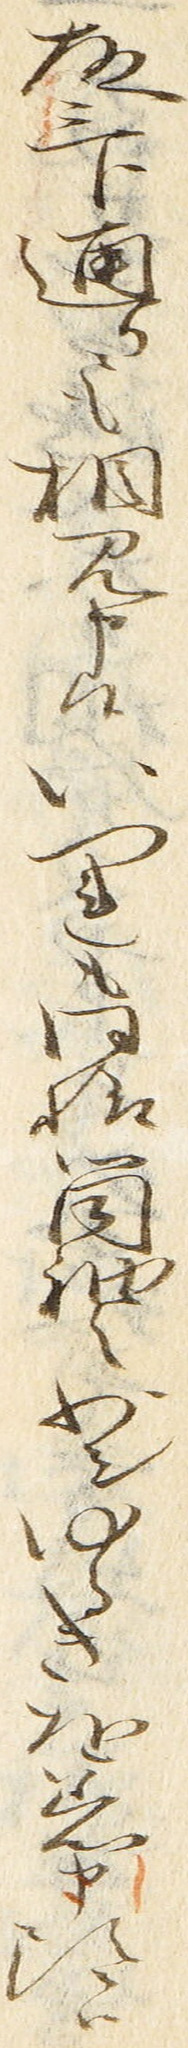故に下通りにも相見申候いつれも同様筒袖之少しゆるきを着申頃には
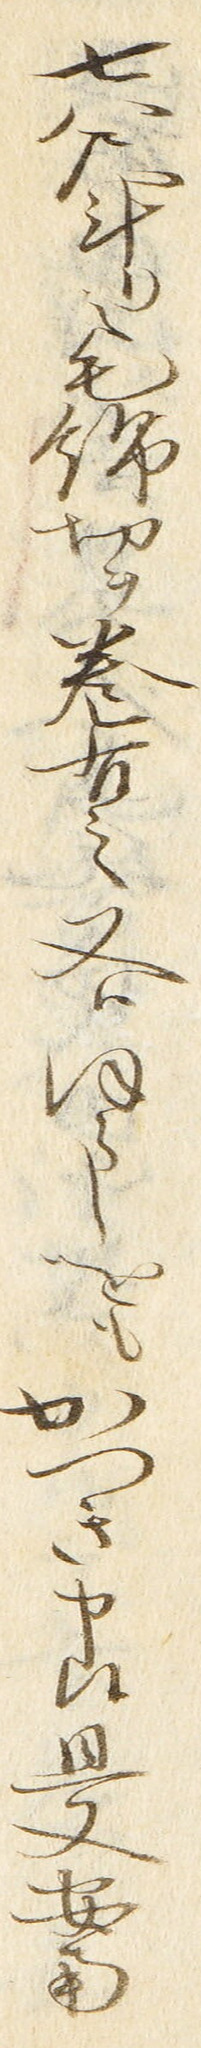七八尺斗り之毛飾切ヲ巻有之又はほらしをもかつき申候且又安用
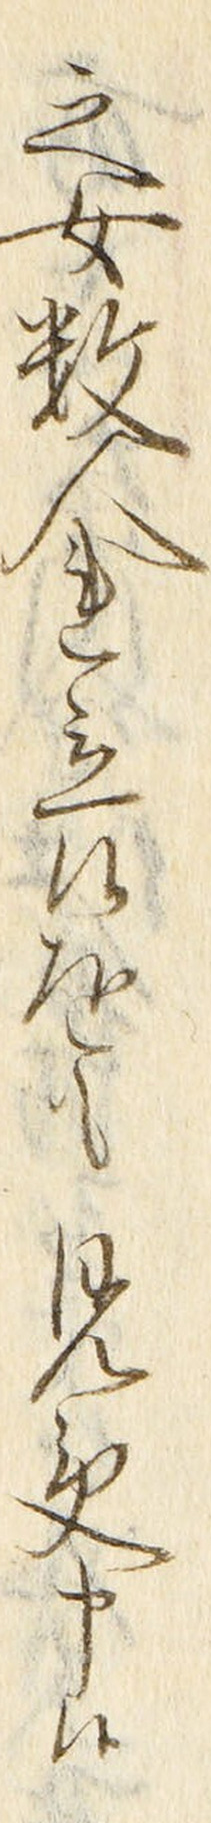之女数人連立候をも見受申候
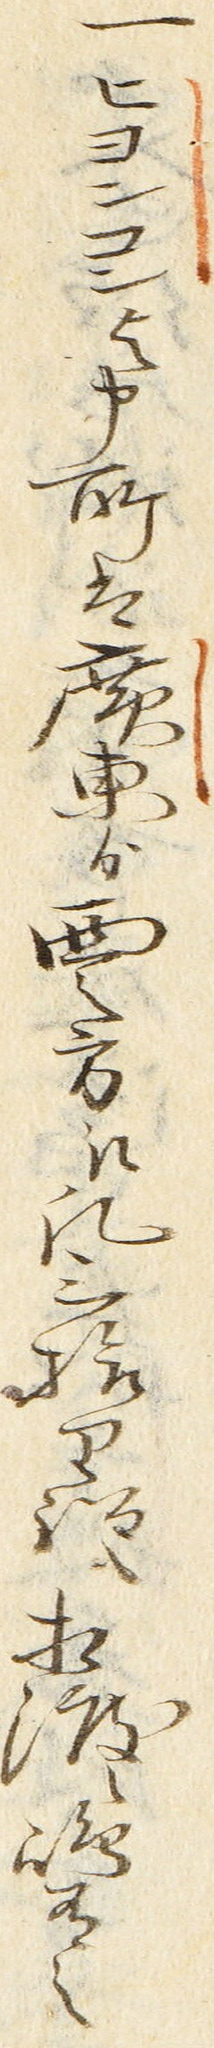一ヒヨンコンと申所は広東ゟ西之方江凡三拾里程へ相渡し嶋あり有之
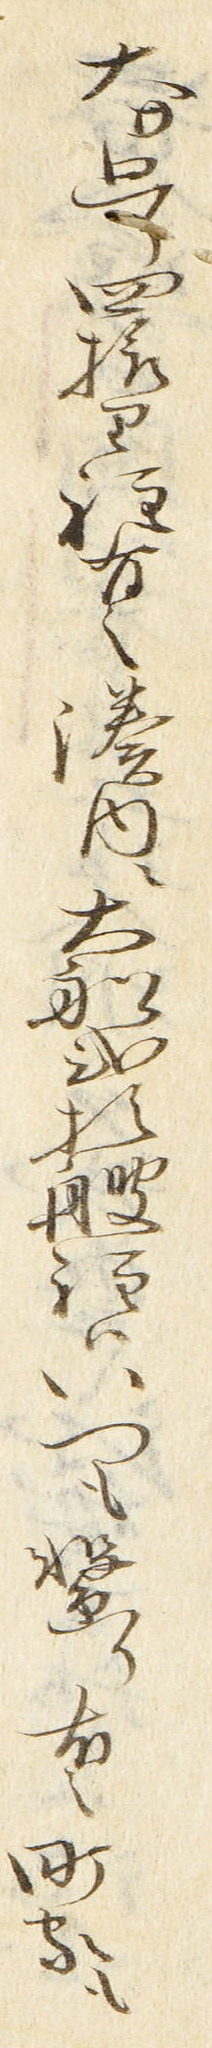大？廻りし四拾里程之湊内に大船弐拾艘程はいつも繋り有之町家も
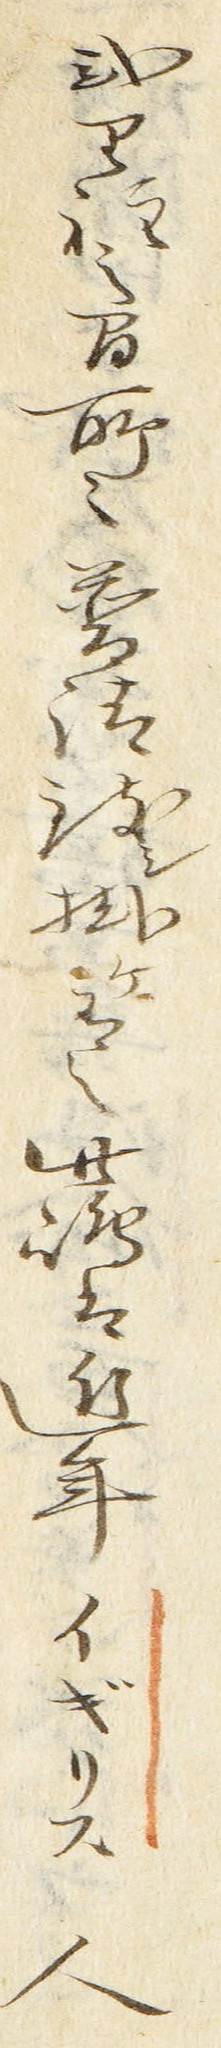弐里程之間所々普請致し掛ケ有之此嶋は近年イギリス人

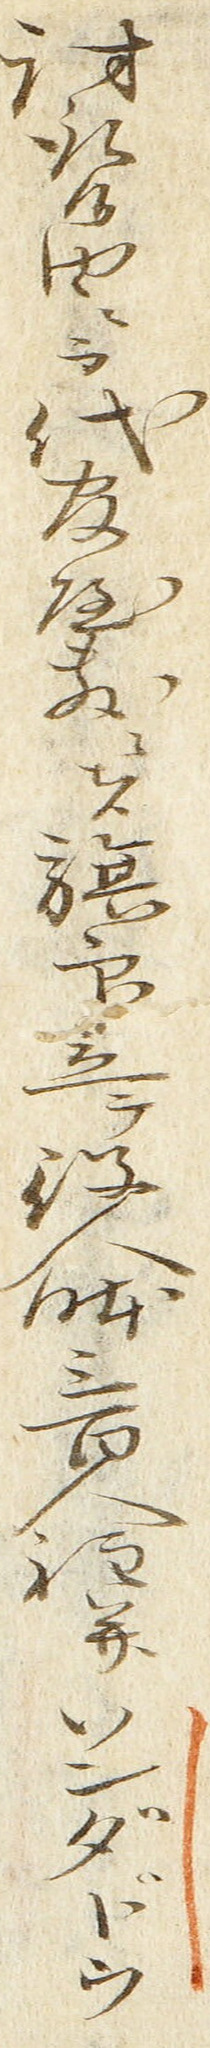討取候由に而代官屋敷には旗印立て役人躰三百人程並ソンダドウ
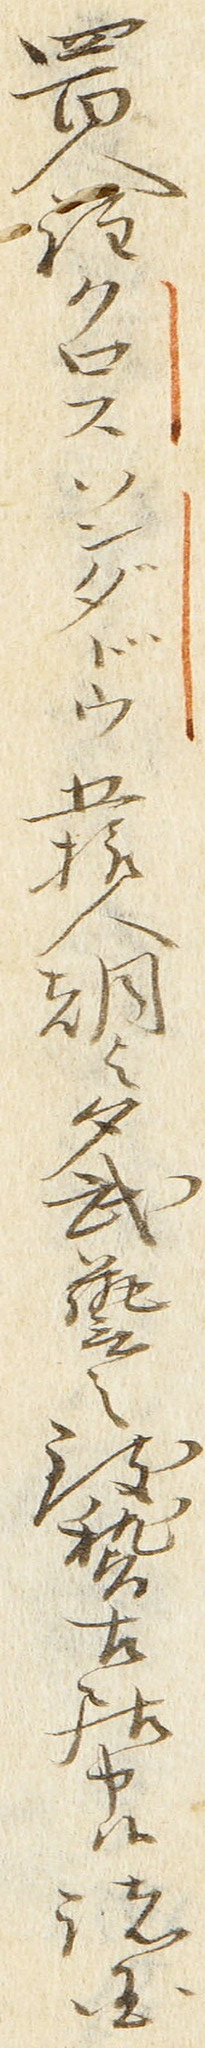四百人程クロスソンダドウ五拾人朝と夕武芸の致稽古居申候諸国
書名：長崎漂流記
